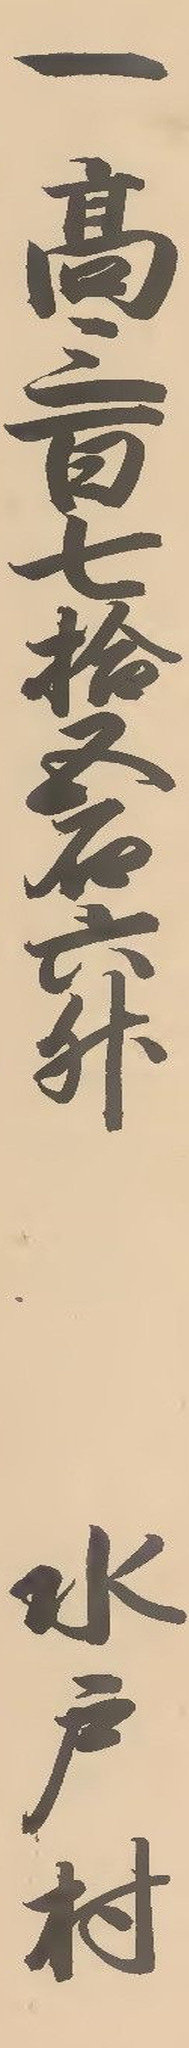一高三百七拾五石六升水戸村
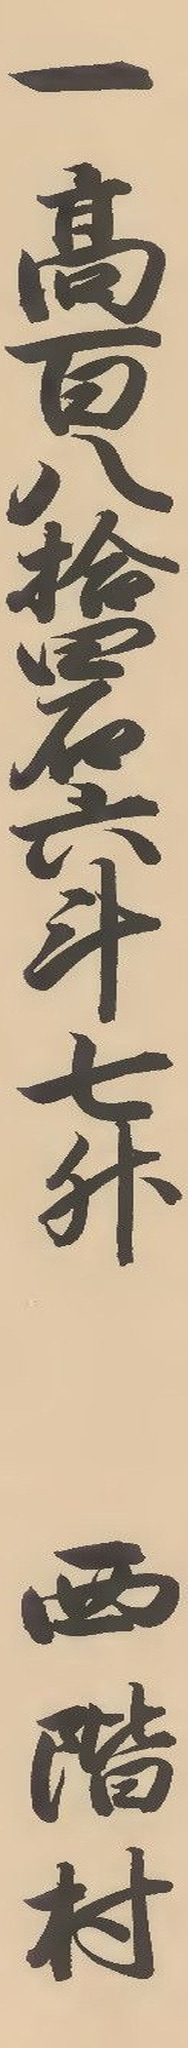一高百八拾四石六斗七升西階村

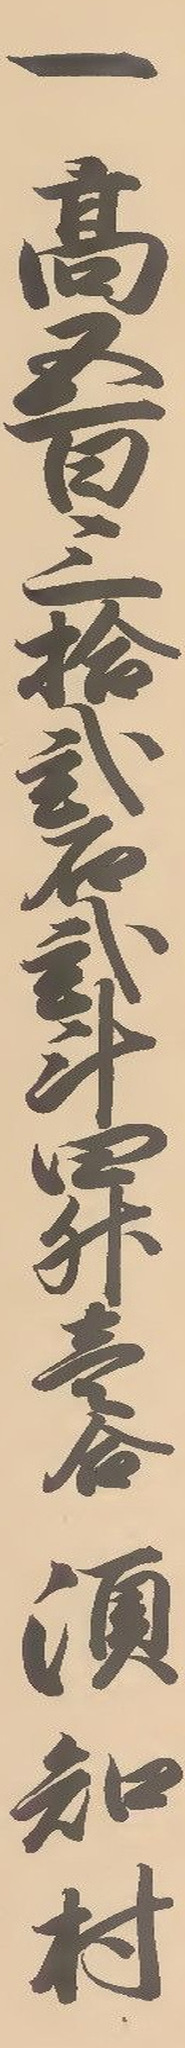一高五百三拾弐石弐斗四升壱合須知村
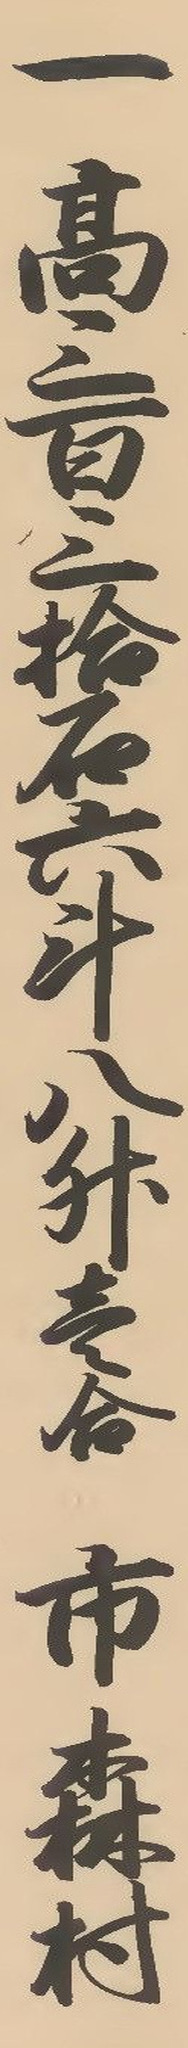一高三百三拾石六斗八升壱合市森村
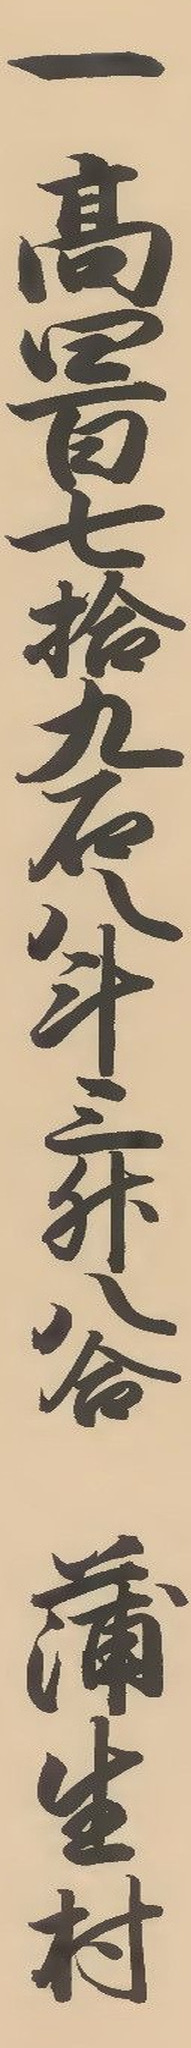一高四百七拾九石八斗三升八合蒲生村

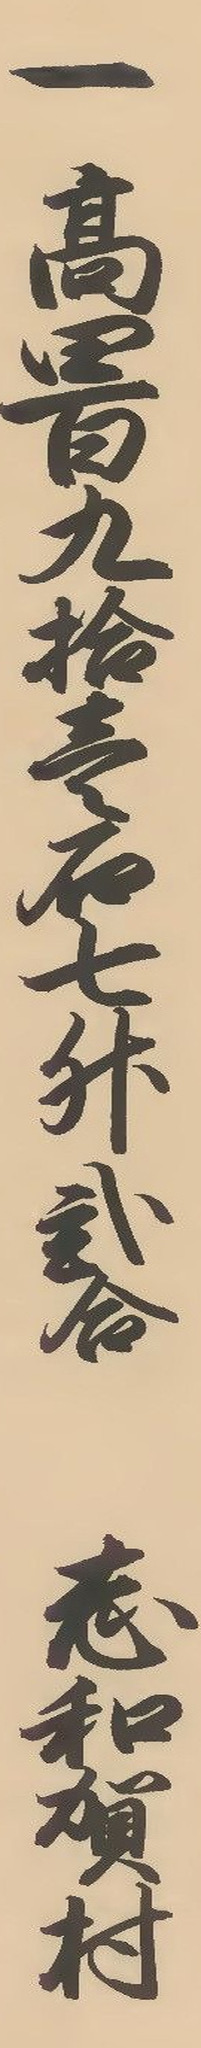一高四百九拾壱石七升弐合志和賀村
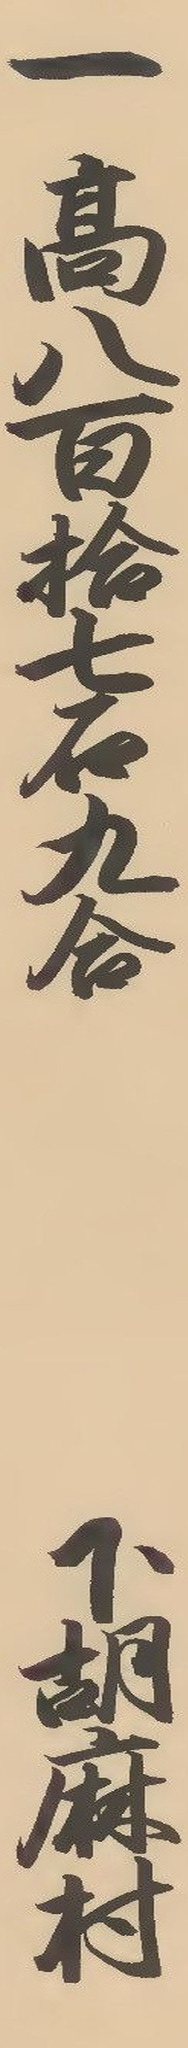一高八百拾七石九合下胡麻村

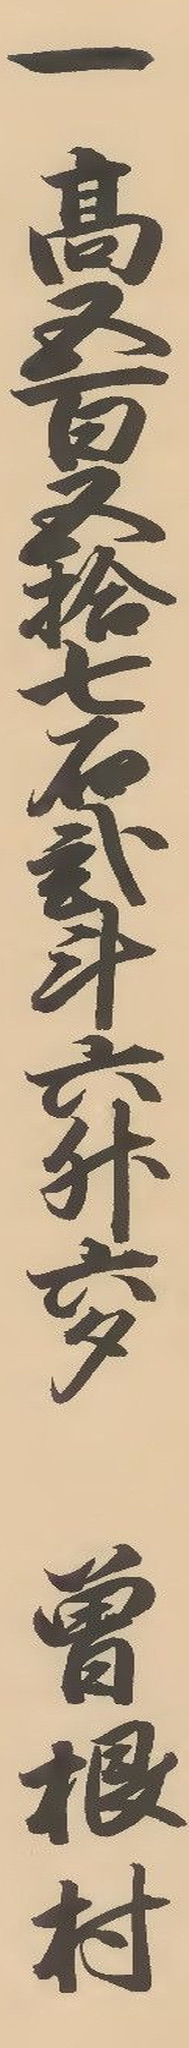一高五百五拾七石弐斗六升六勺曽根村
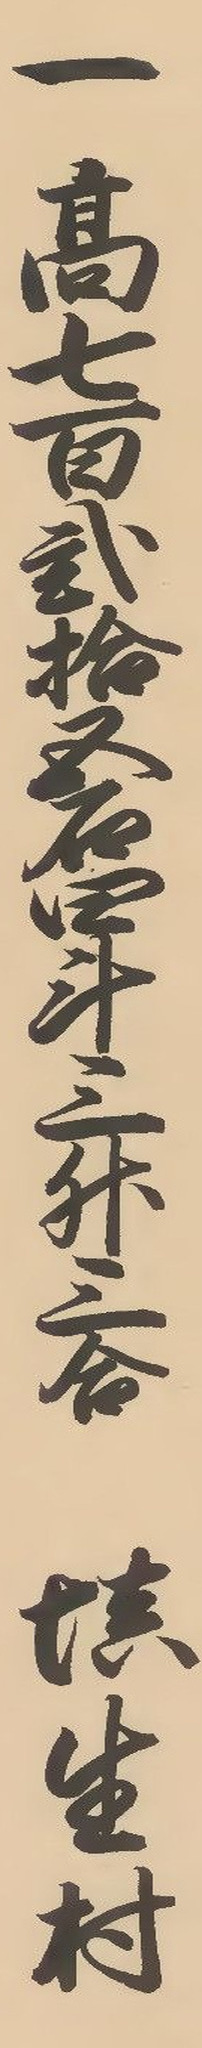一高七百弐拾五石四斗三升三合埴生村
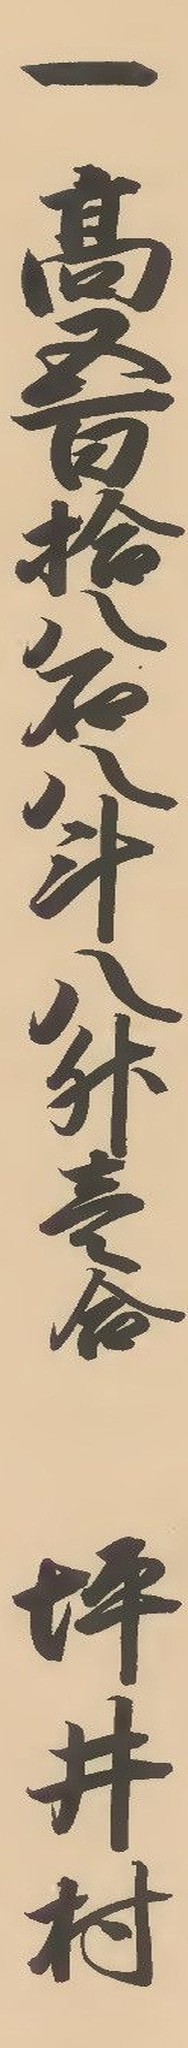一高五百拾八石八斗八升壱合坪井村
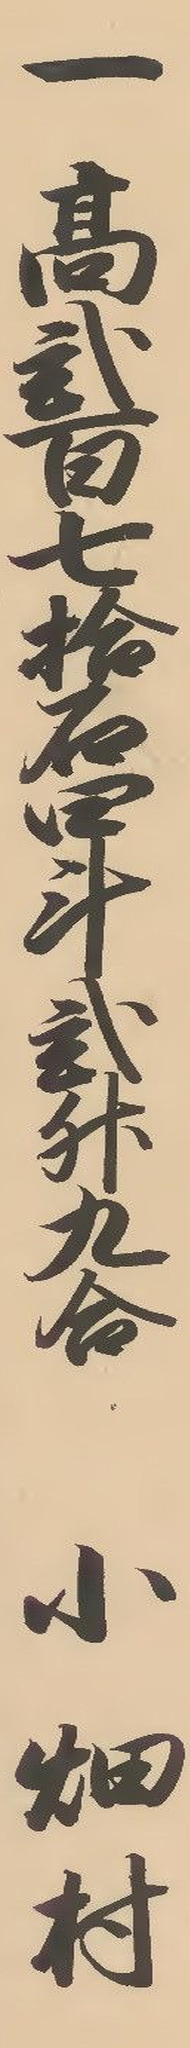一高弐百七拾石四斗弐升九合小畑村
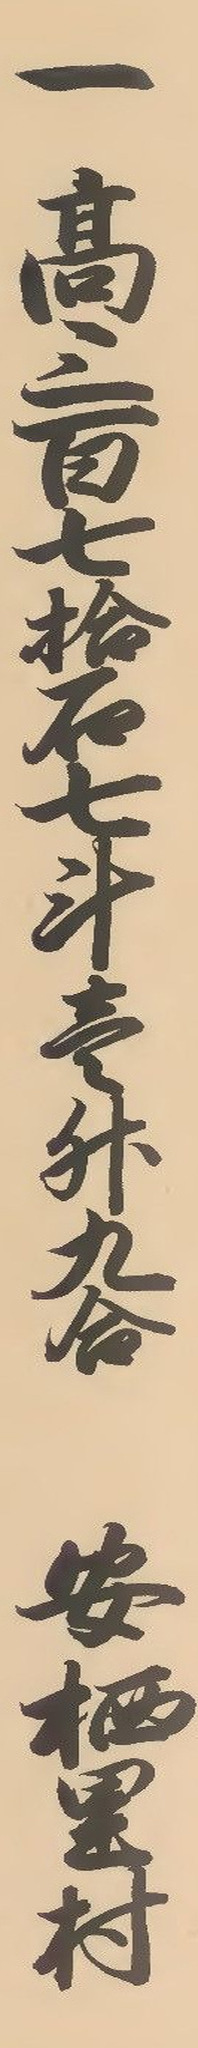一高三百七拾石七斗壱升九合安栖里村
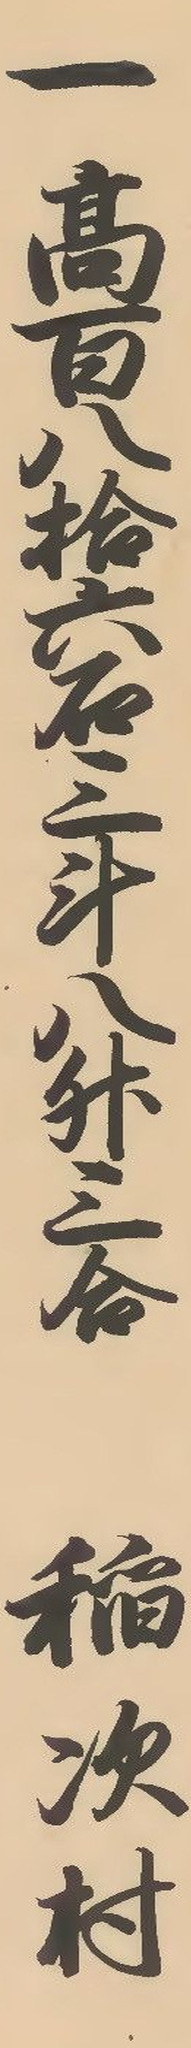一高百八拾六石三斗八升三合稲次村
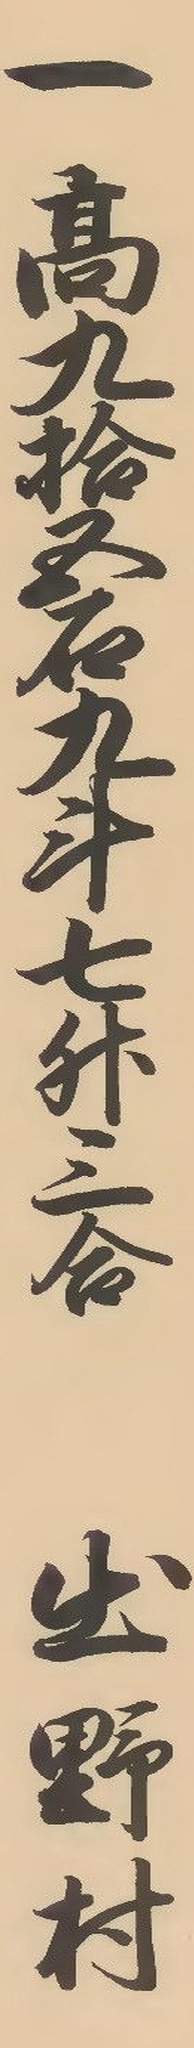一高九拾五石九斗七升三合出野村
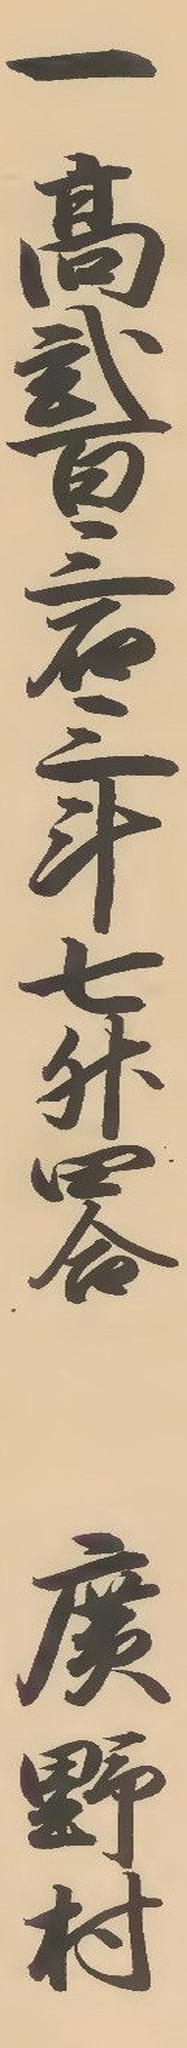一高弐百三石三斗七升四合広野村

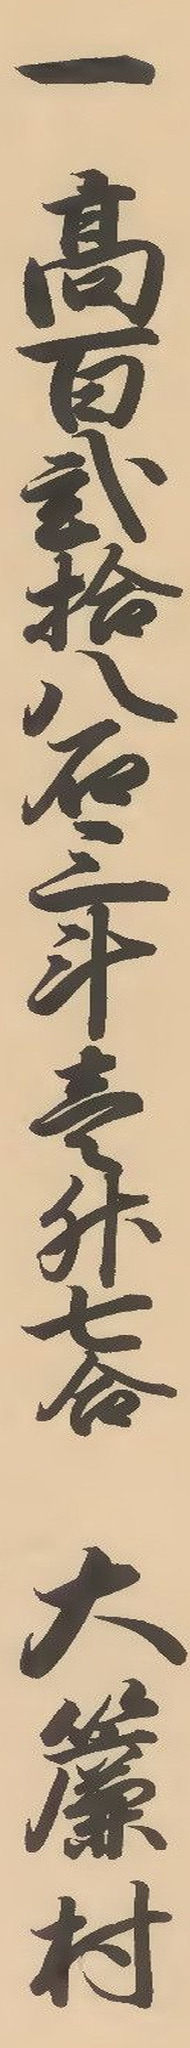一高百弐拾八石三斗壱升七合大簾村
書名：丹波国郷帳
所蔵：国立公文書館 National Archives of Japan
